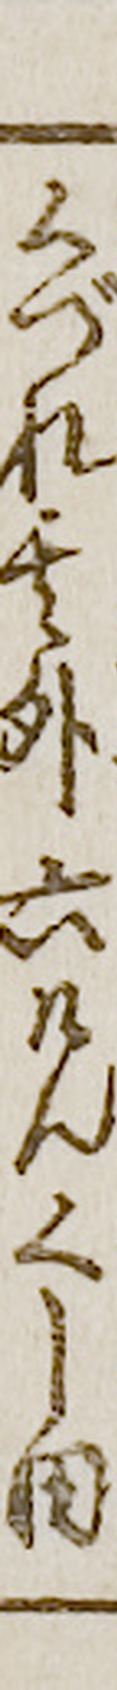くづれ其外六けんくし田
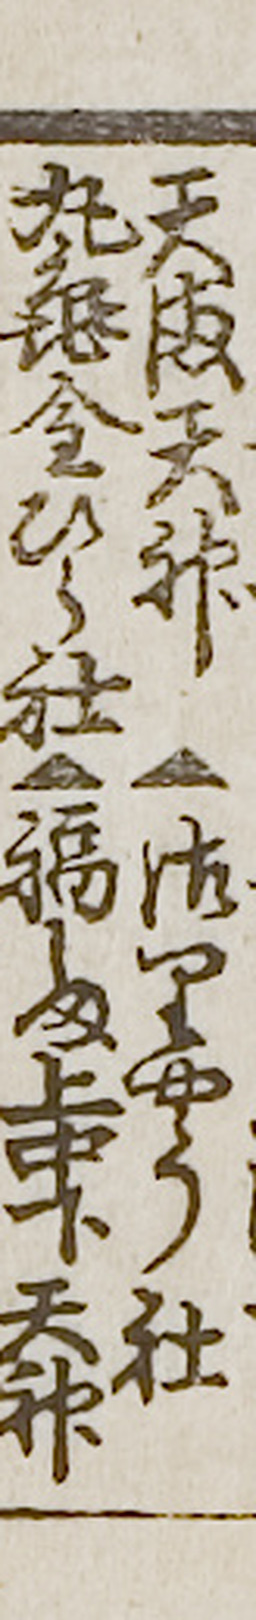丸亀金ひら社▲福しま上中下天神
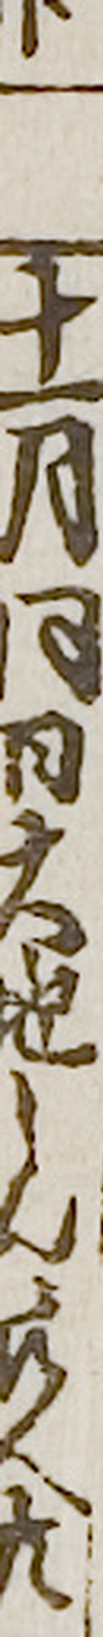十一月同日大地しんに候へ共
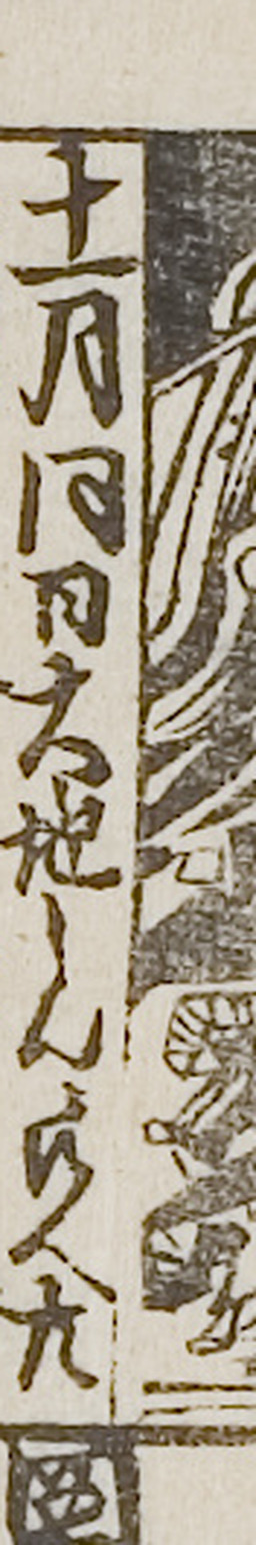十一月同日大地しんに候へ共
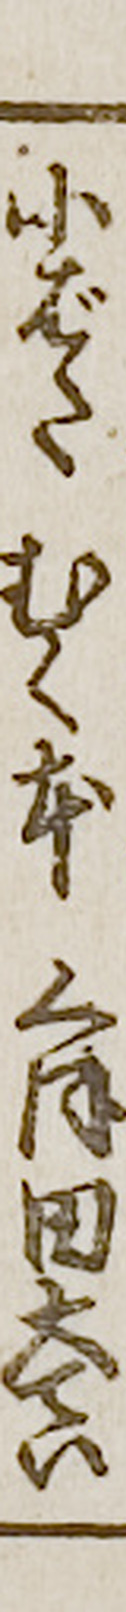小ばたむく本く津田大てい
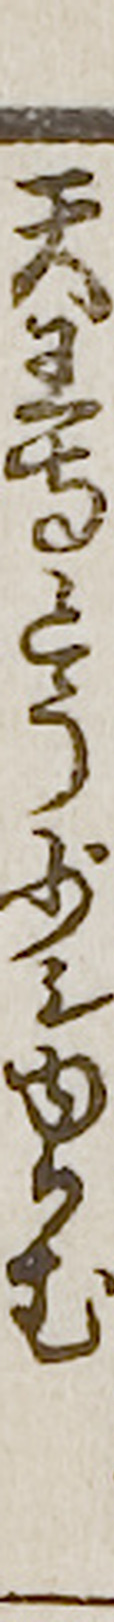天王寺とう少しゆかむ
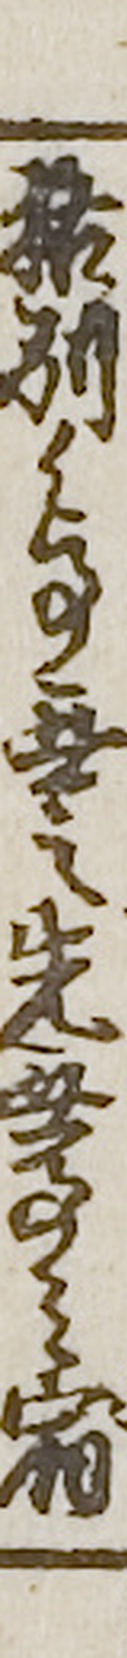格別之事無之先無事之宿
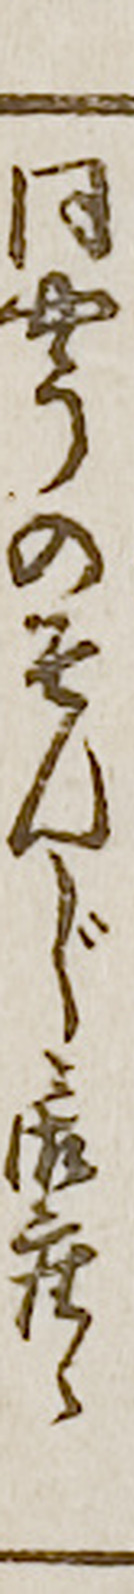同やうのそんじに御座候
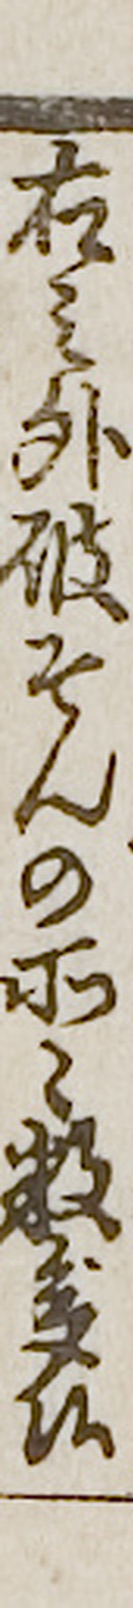右の外破そんの所々数多候
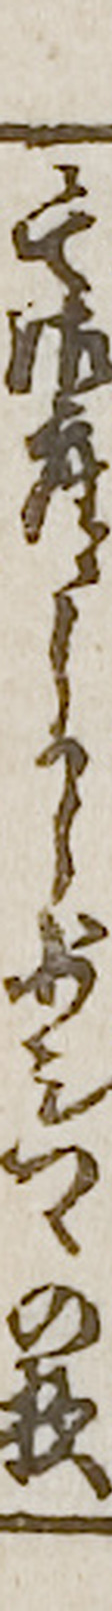にて御座候しかし少しつゝの損
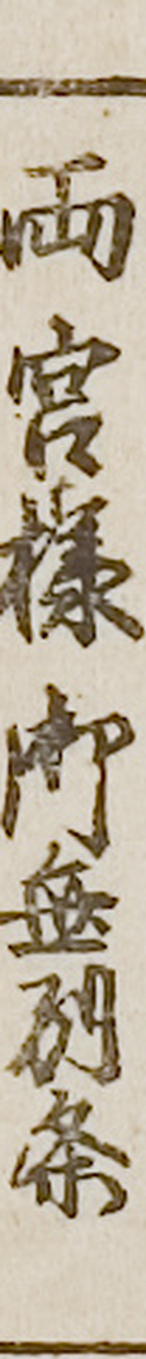両宮様御無別条
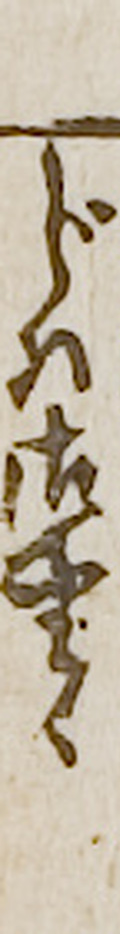じは御座候
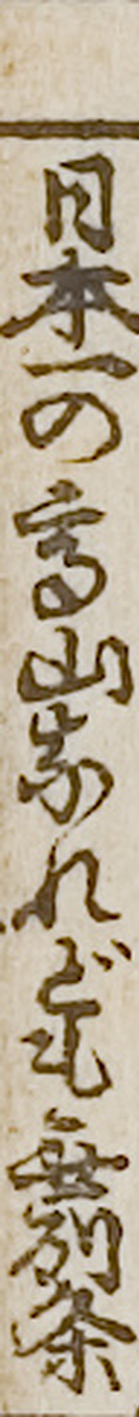日本一の高山なれども無別条
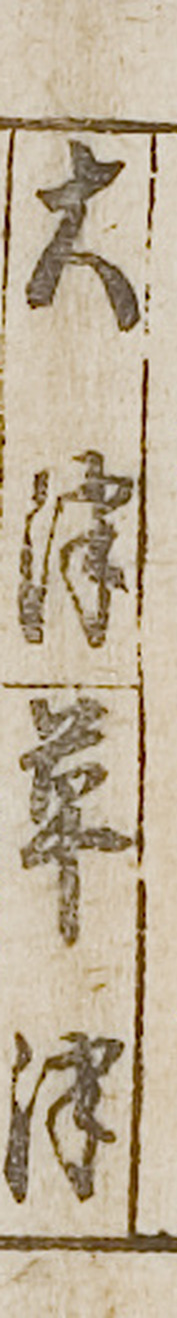大津草津
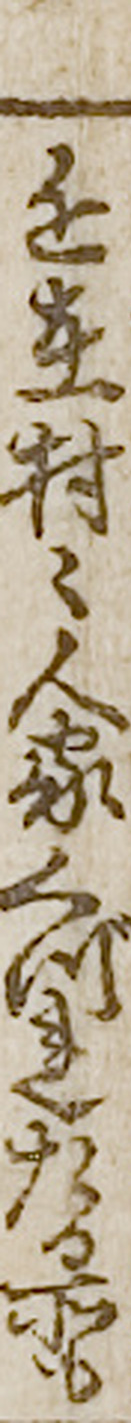近在村々人家くづれたる所も
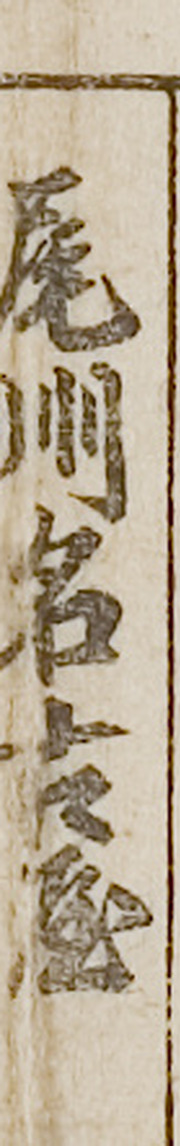尾州名古屋
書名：大阪大地震一覧
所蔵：東京大学総合図書館 General Library in the University of Tokyo, JAPAN
